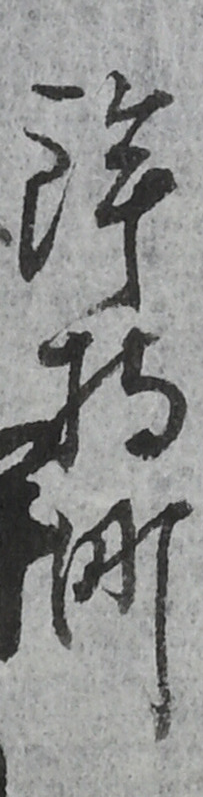鉾持町
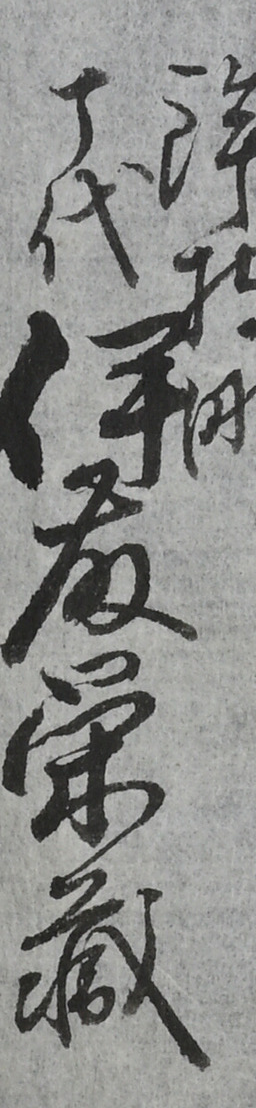丁代伊藤栄蔵

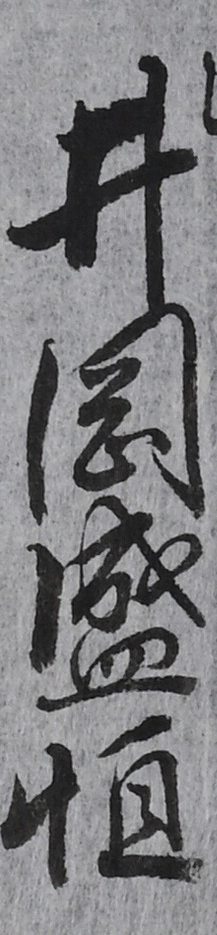井岡盛恒
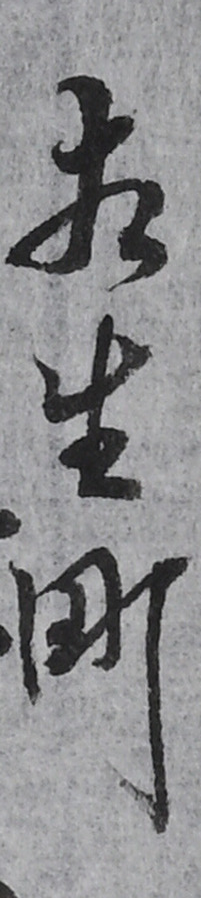相生町
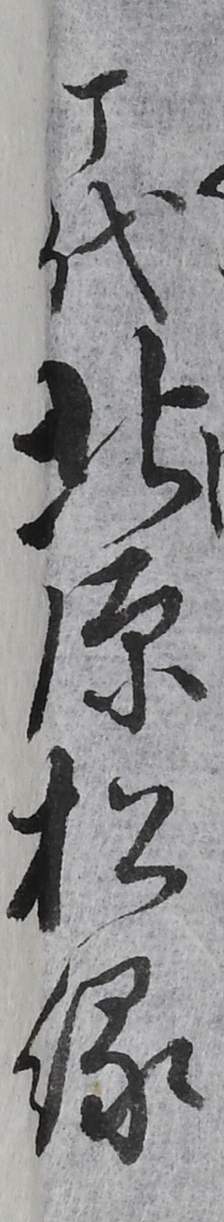丁代北原松縁
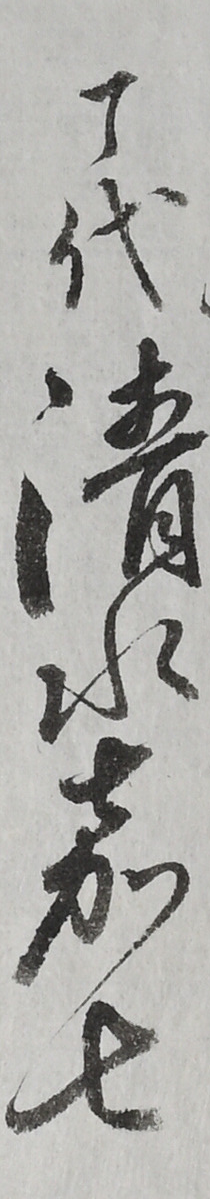丁代清水嘉七
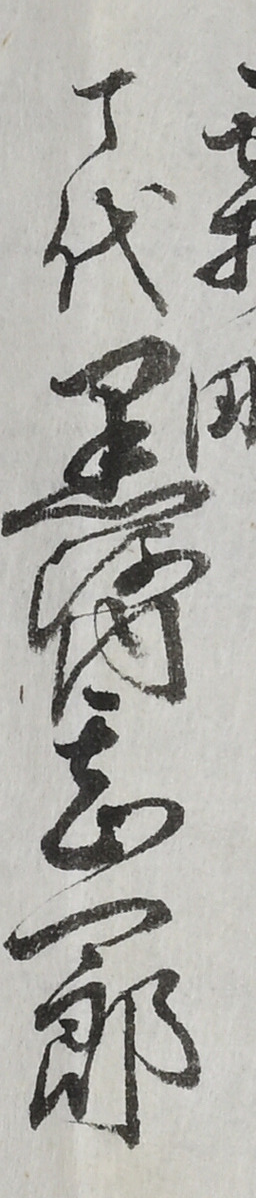丁代黒河内甚一郎
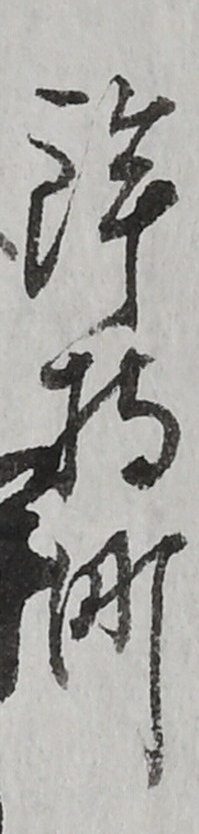鉾持町
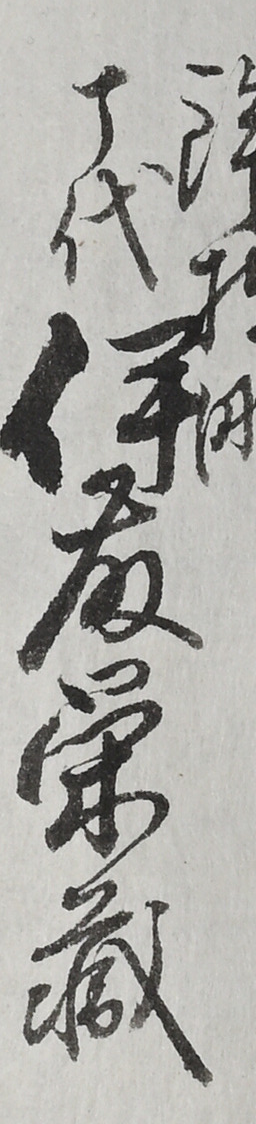丁代伊藤栄蔵
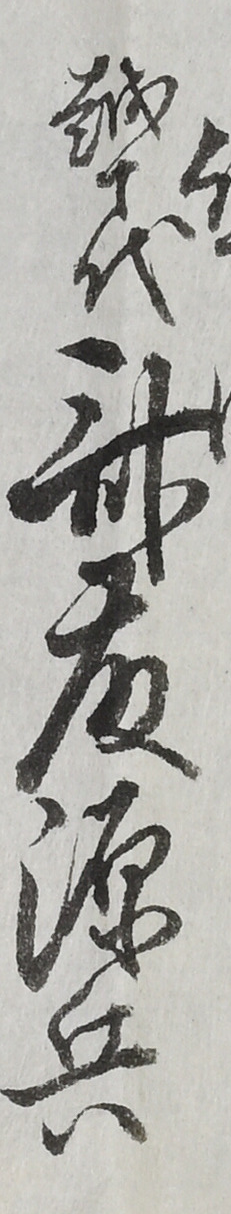越丁代斎藤源兵
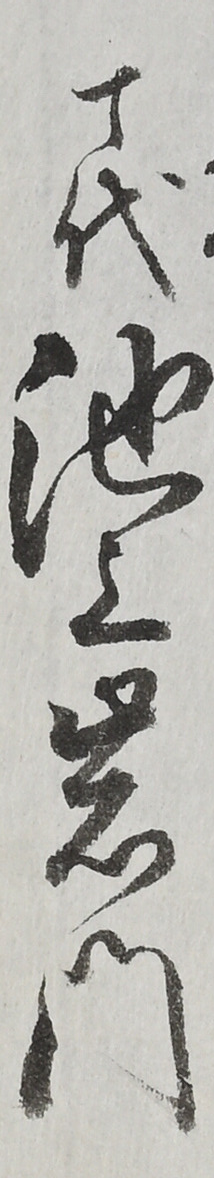丁代池上岩門
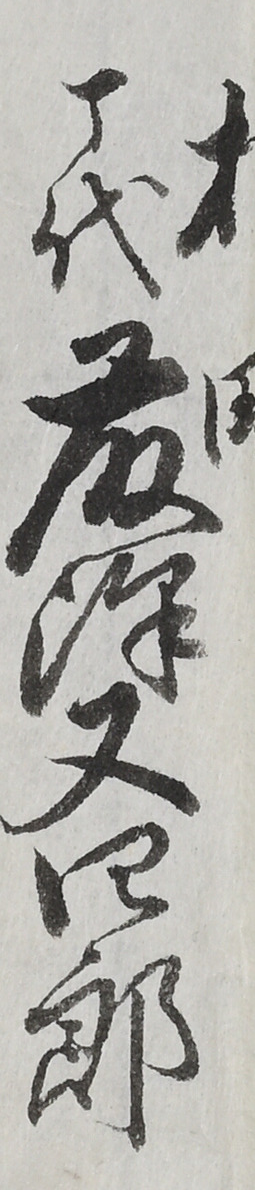丁代藤沢又四郎
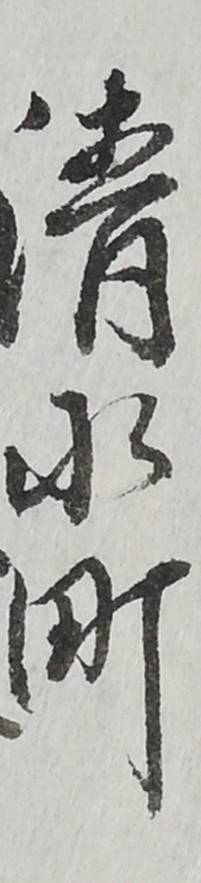清水町
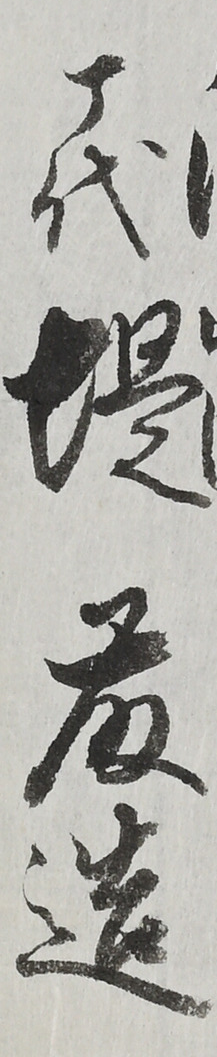丁代堤藤造
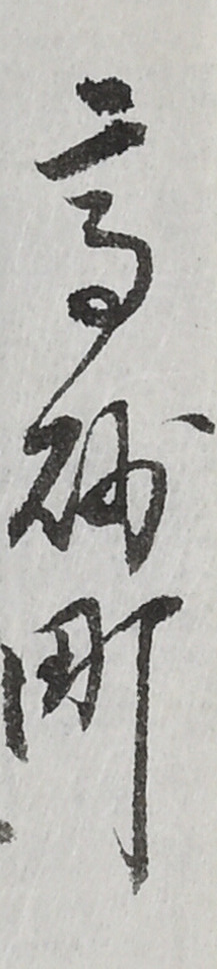高砂町
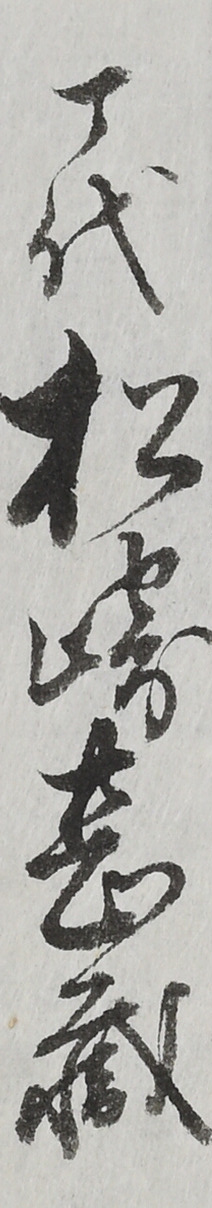丁代松崎甚蔵
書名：記
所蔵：伊那市立高遠町図書館・合同会社AMANE
